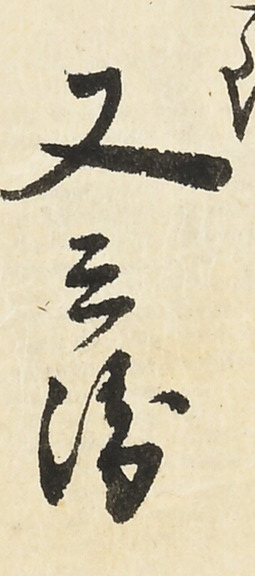又兵衛
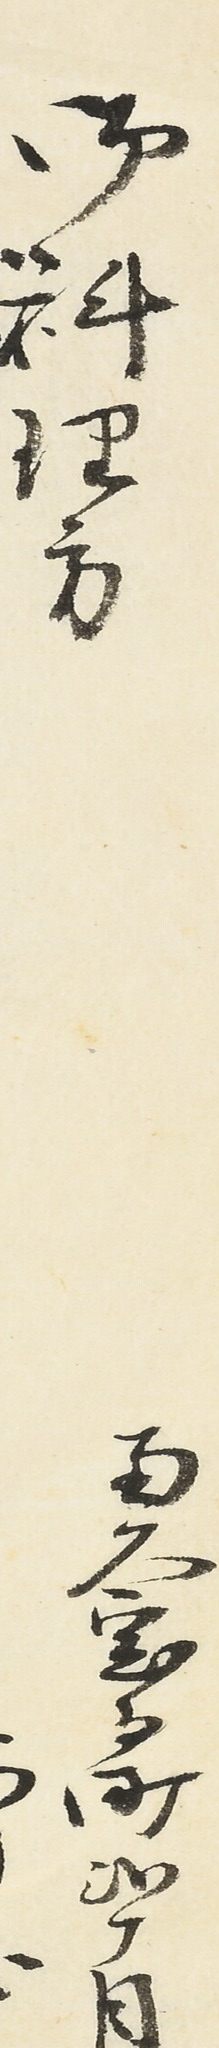御料理方南久宝寺町弐丁目
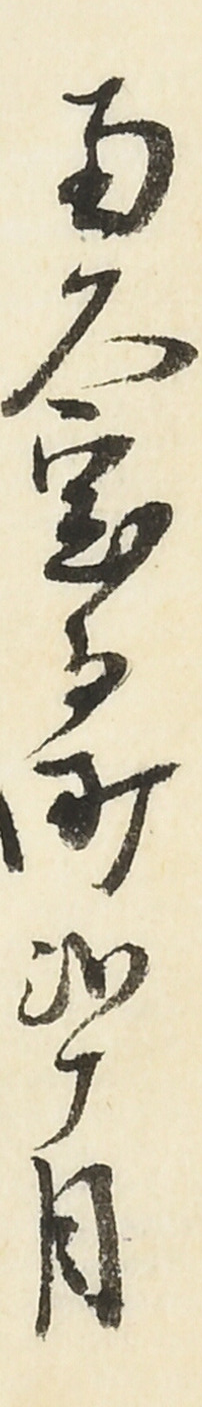北久宝町弐丁目
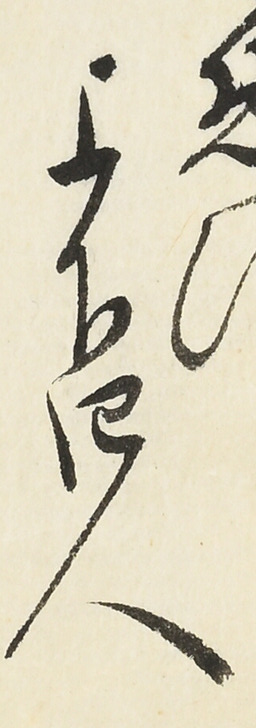上下四人
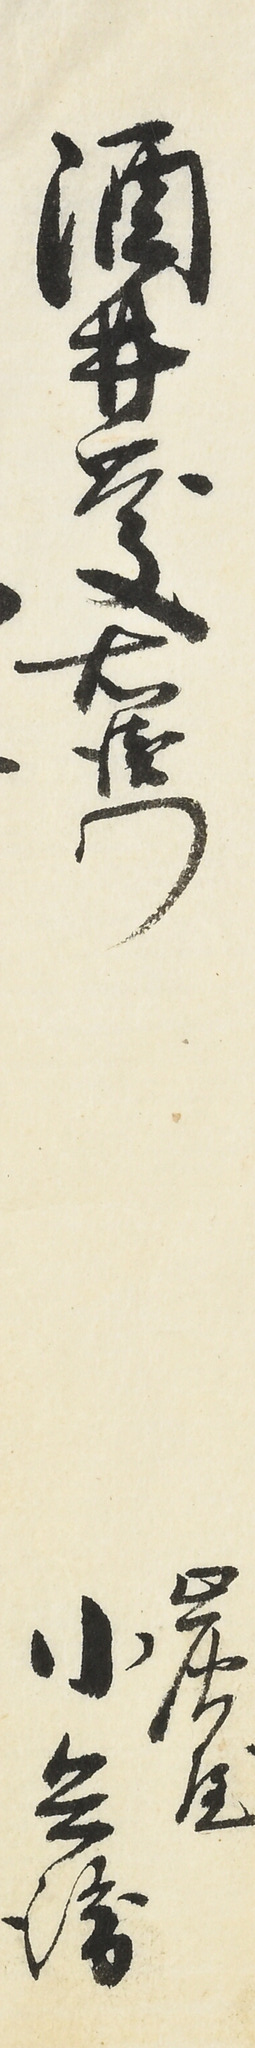・一酒井慶右衛門炭屋
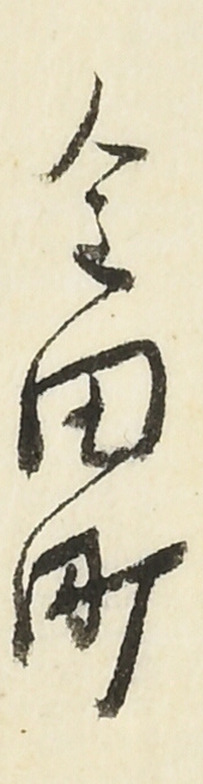金田町
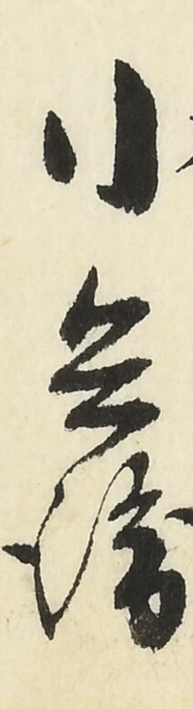又兵衛
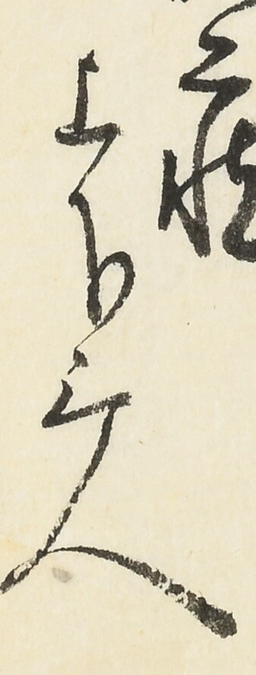上下三人

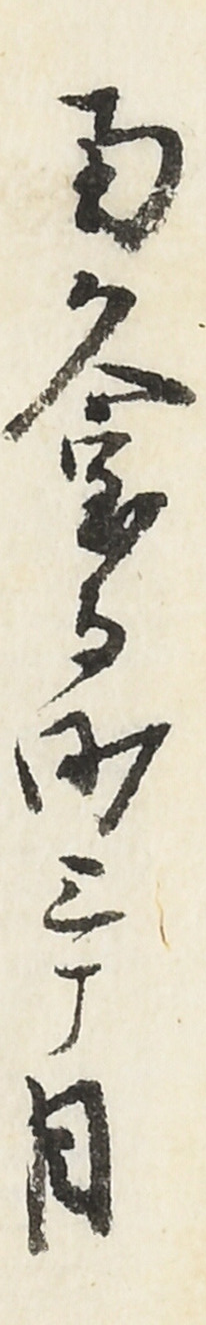南久宝寺町三丁目
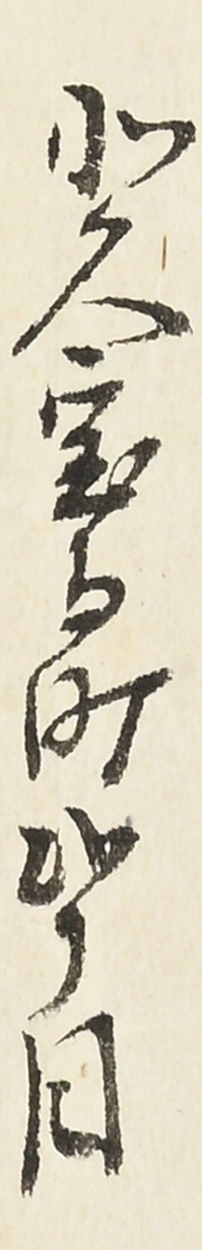北久宝寺町弐丁目
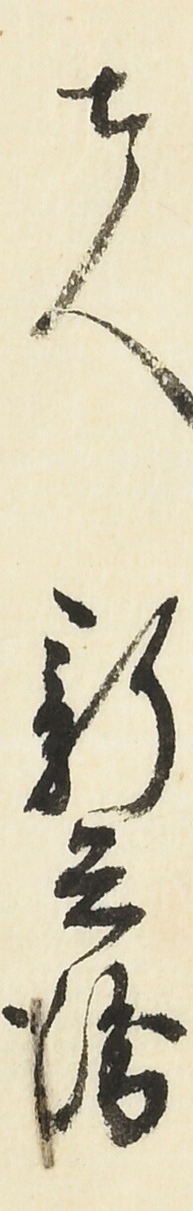七人新兵衛
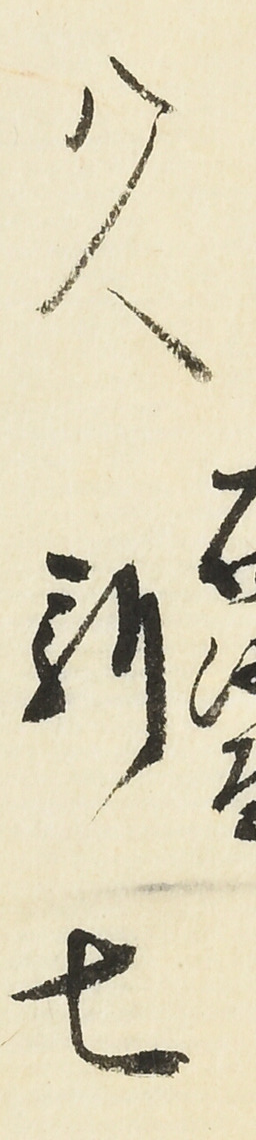八人新七
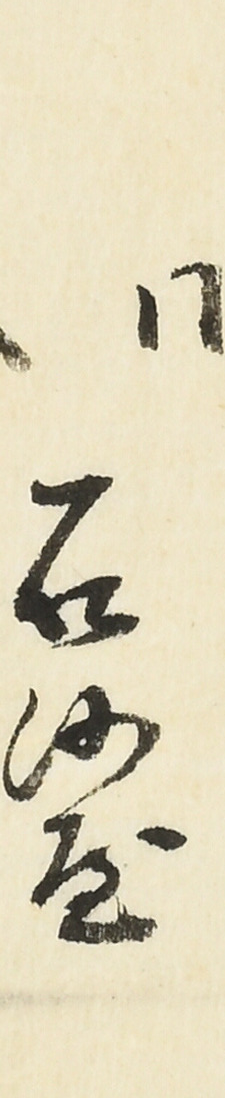石沙屋
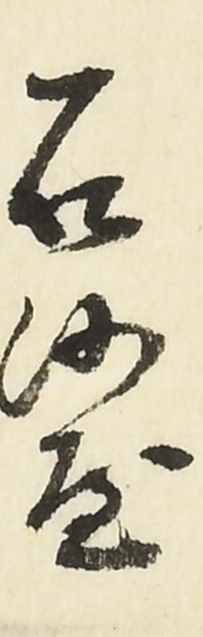石沙屋
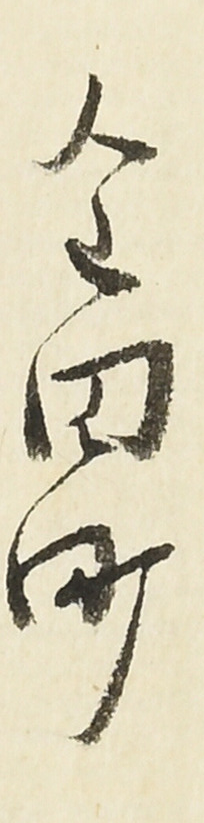金田町
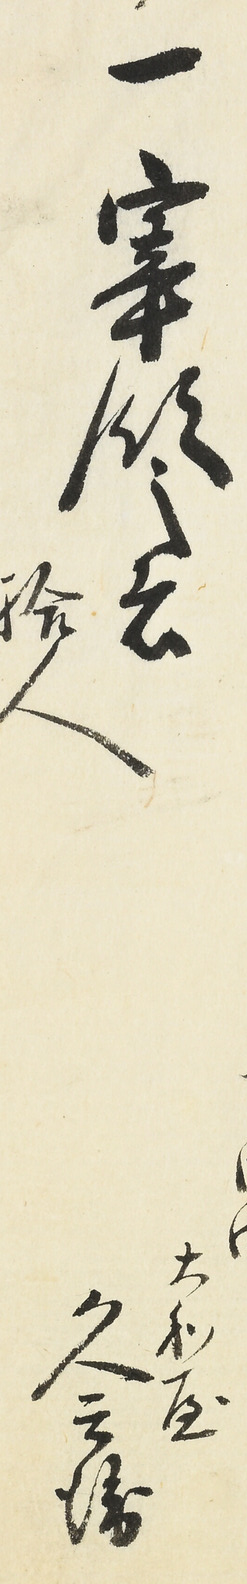一宰領之者大和屋
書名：内藤大和守下宿割
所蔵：伊那市立高遠町図書館・合同会社AMANE
